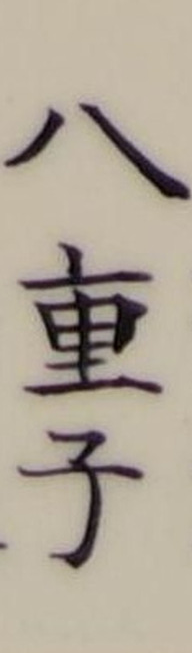八重子
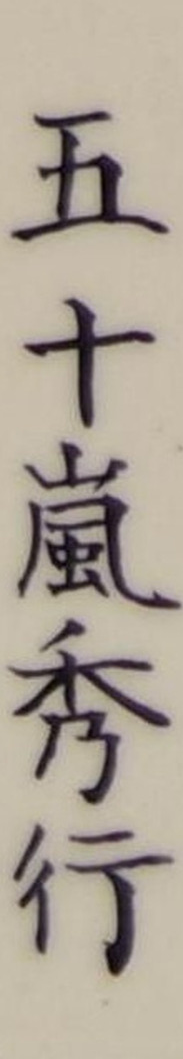五十嵐秀行

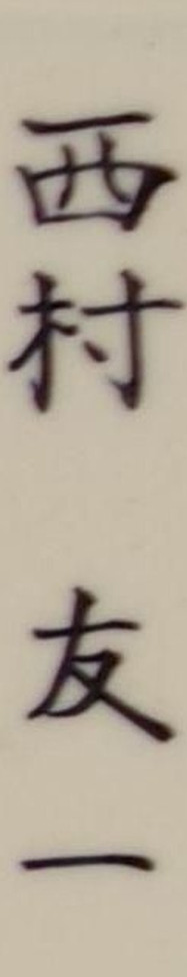西村友一
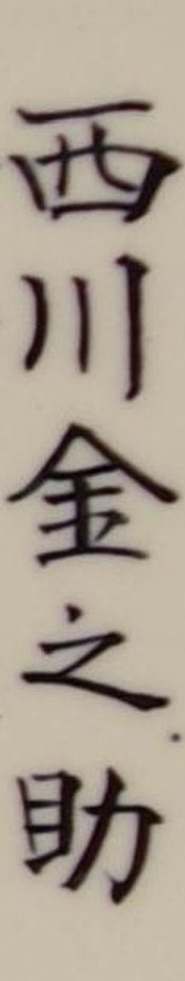西川金之助
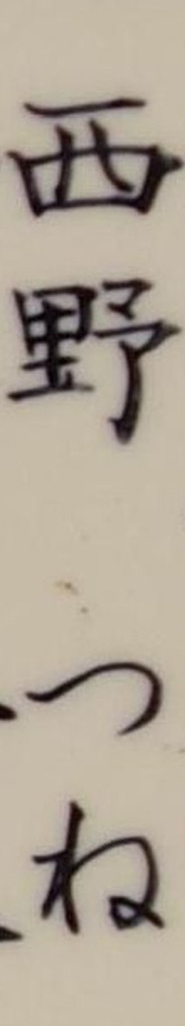西野つね
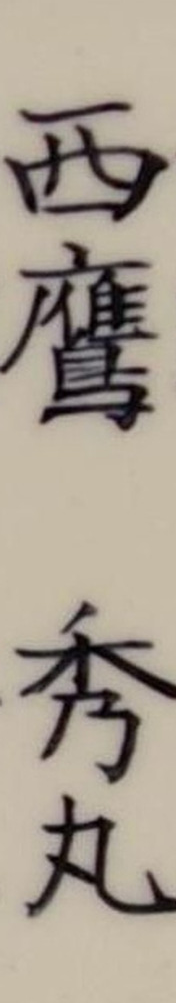西鷹秀丸
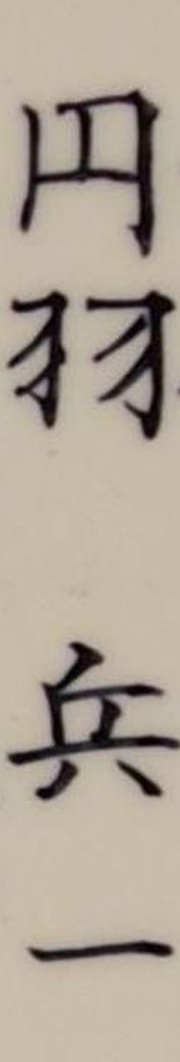円羽兵一
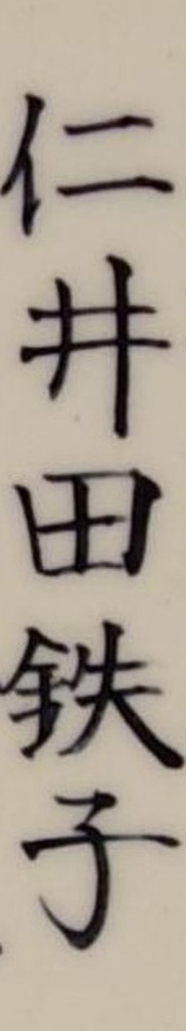仁井田鉄子
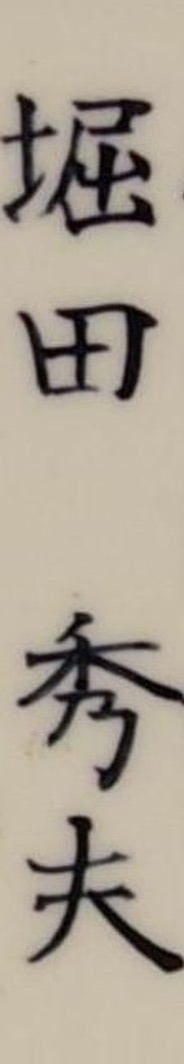堀田秀夫
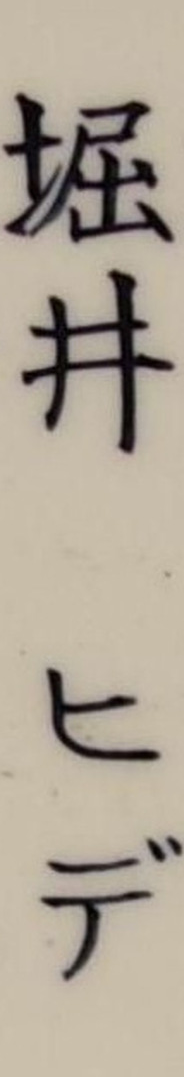堀井ヒデ
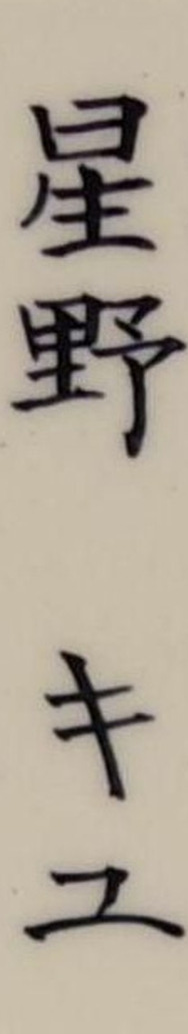星野キユ
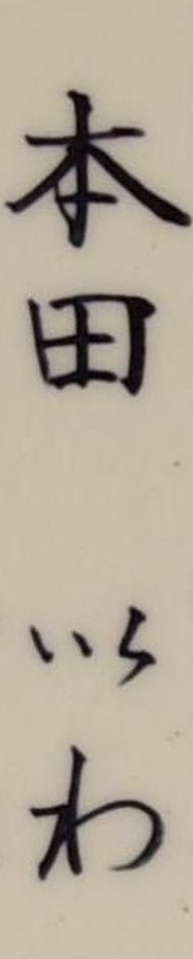本田いわ
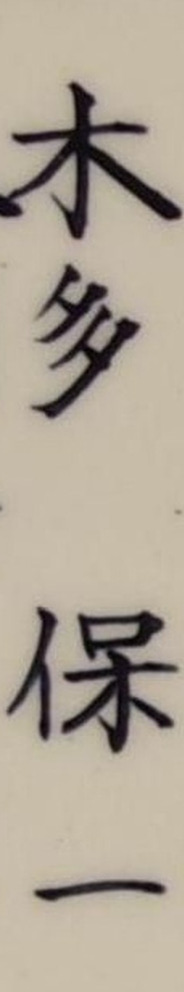木多保一
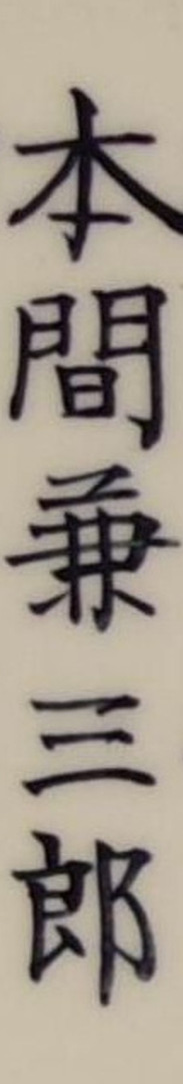本間兼三郎
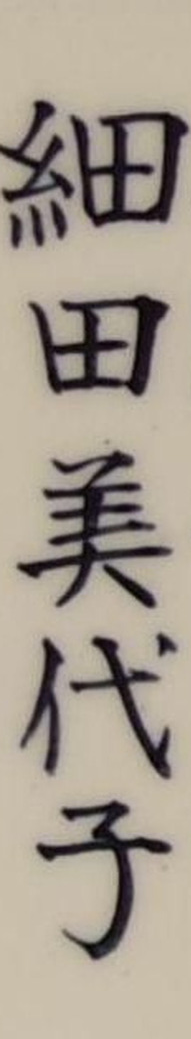細田美代子
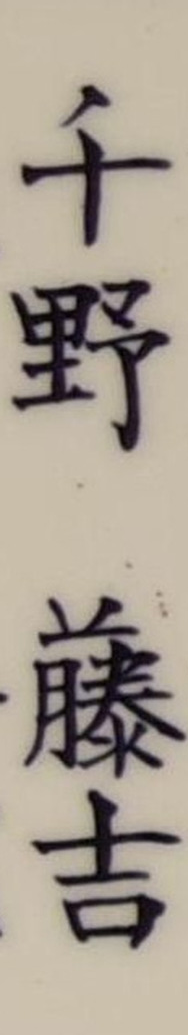千野藤吉
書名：E~L
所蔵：高野山金剛峯寺
